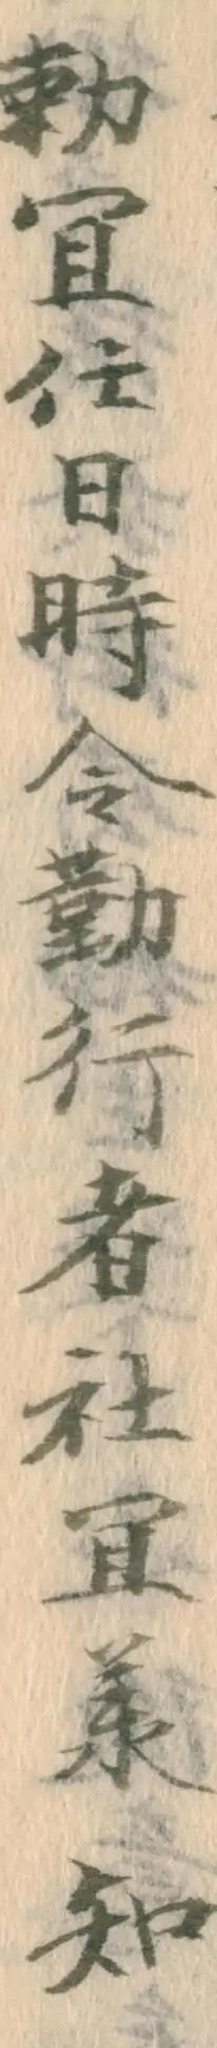勅宜任日時令勤行は社宜承知
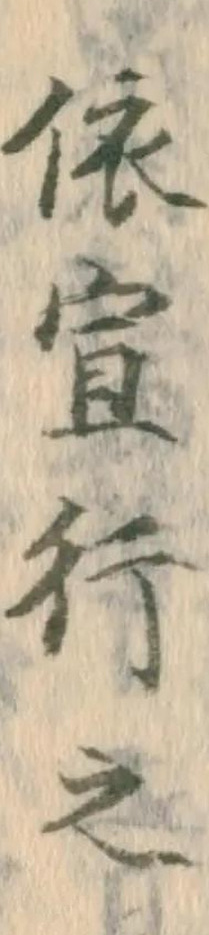依宣行之
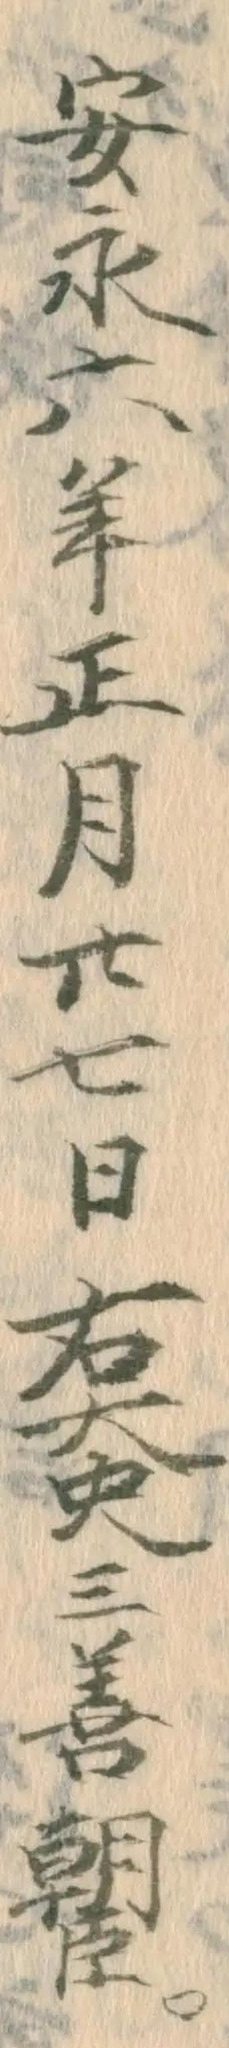安永六年正月廿七日右大史三善朝臣奉
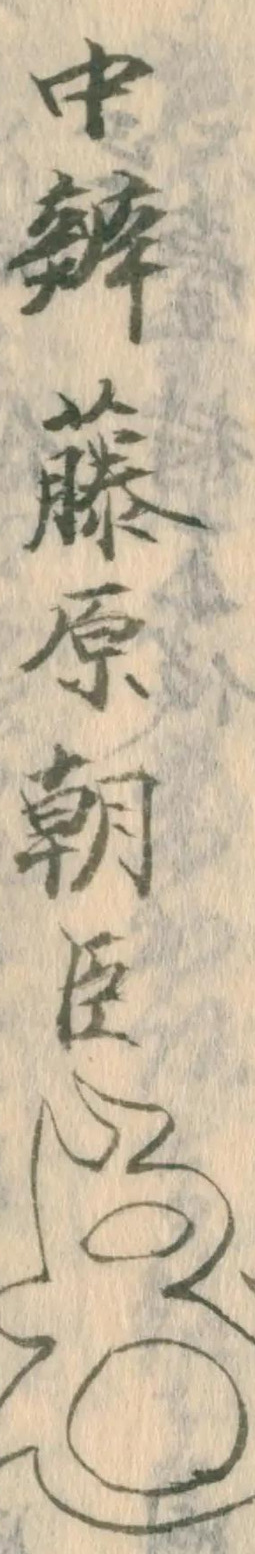中弁藤原朝臣
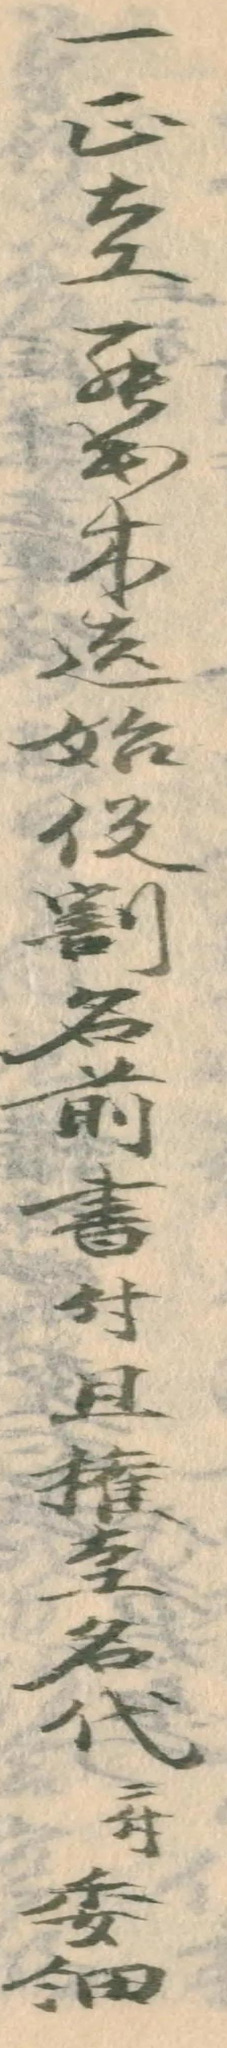一正大工罷出木造始役割名前書付且権大工名代ニ付委細
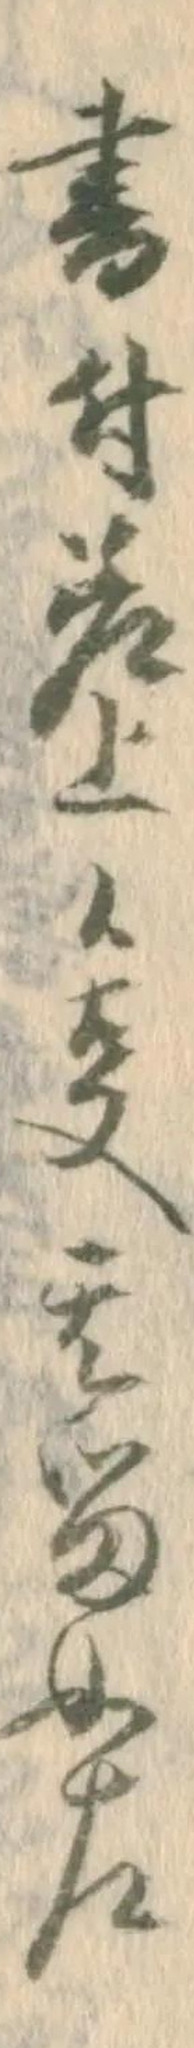書付差上候事其留如左
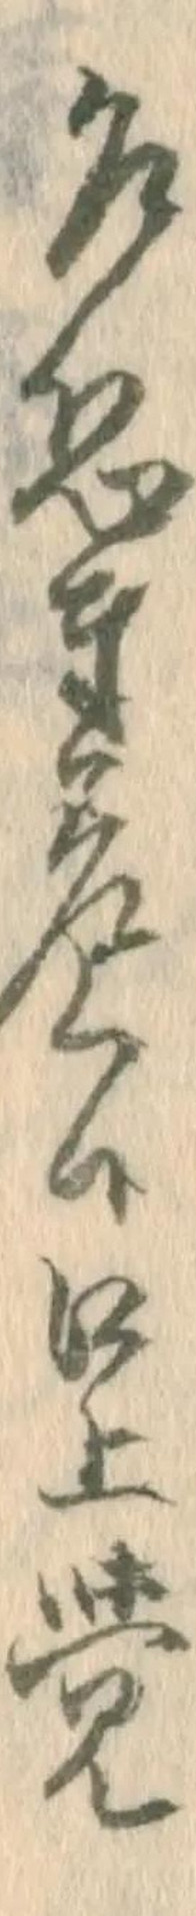乍恐奉差上候口上覚
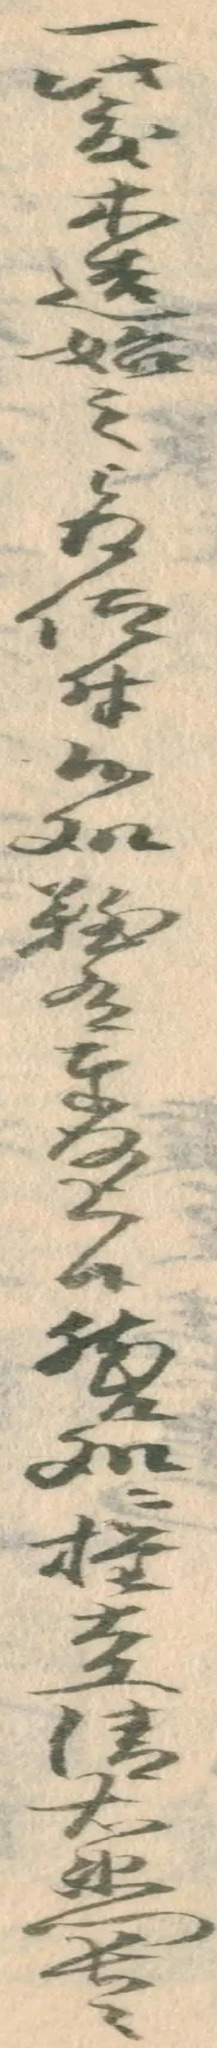一此度木造始之被為仰付候処難有奉存上候然ル処ニ権大工清右衛門長々
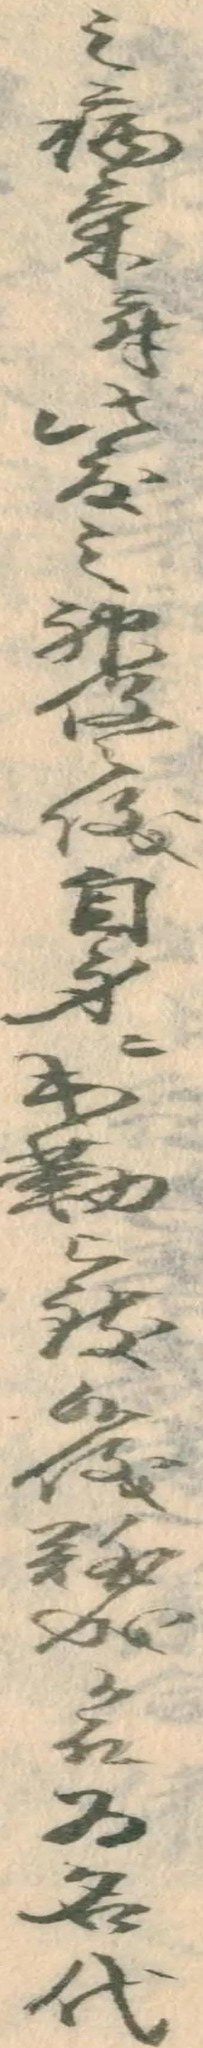之病気ニ付此度之神役之儀自身ニ出勤被致候儀難成候故為名代
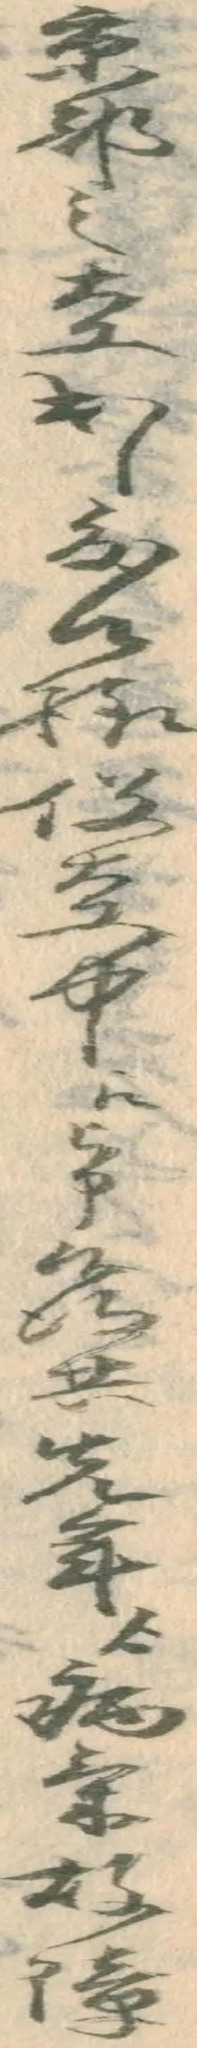京都之大工出し度候様役大工中江被申候得共先年ゟ病気故障
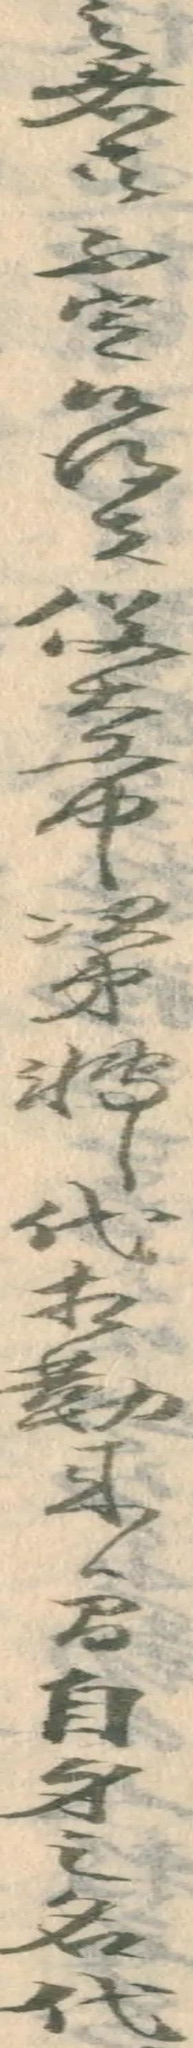之者共不定候得は役大工中次第転し代相勤来候間自身之名代ニ
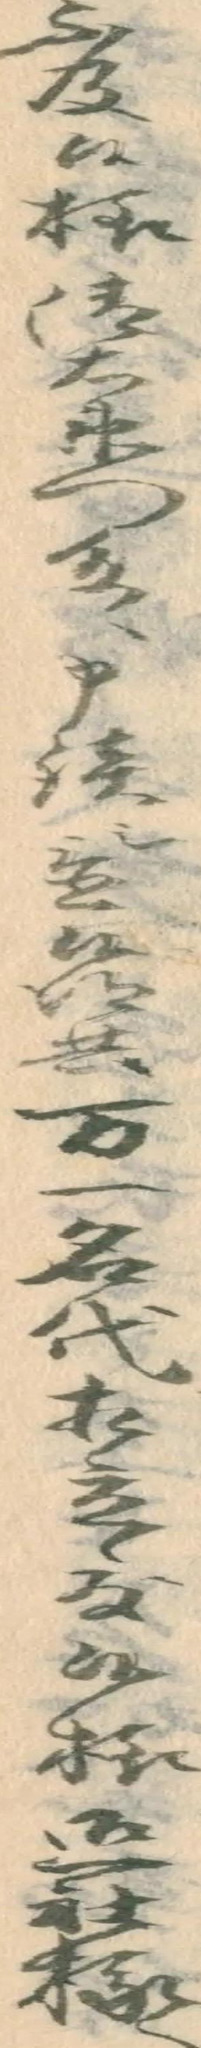不及候様清右衛門殿へ申談シ置候得共万一名代相立度候様御一社様へ

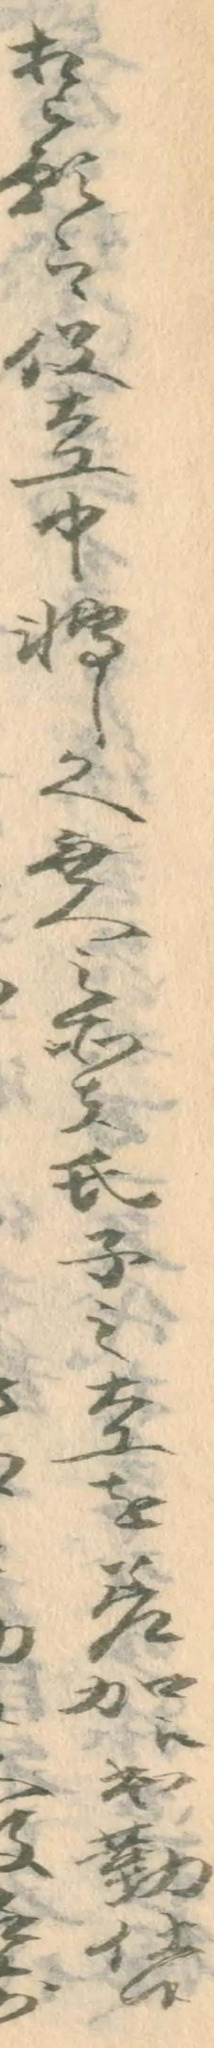相被願候ハヽ役大工中転しかへ無人之所は氏子之大工を差加江出勤仕候
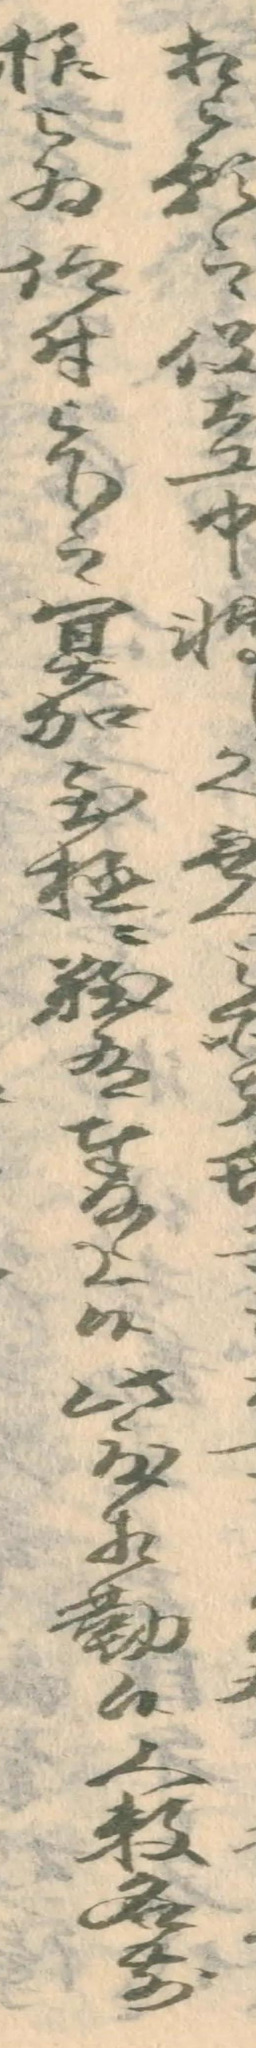様被為仰付被下候ハヽ冥加至極ニ難有奉存上候此度相勤候人数名前
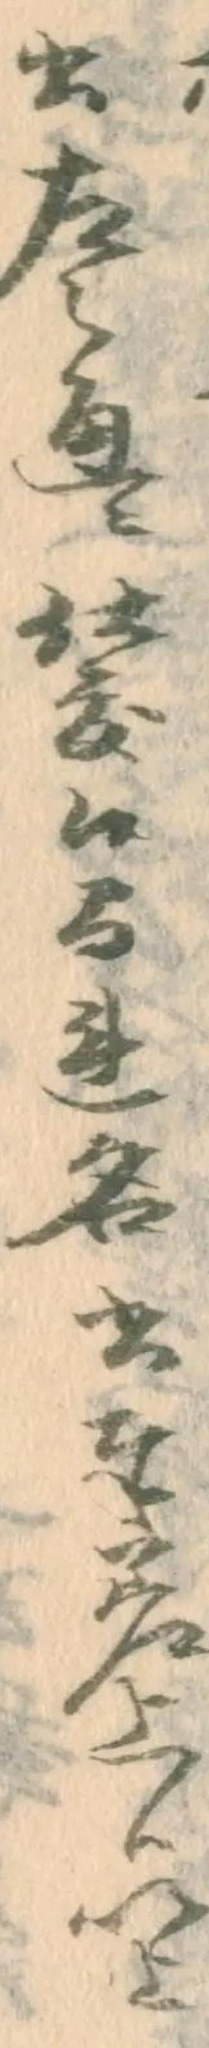書左之通ニ仕度候間連名書奉差上候以上
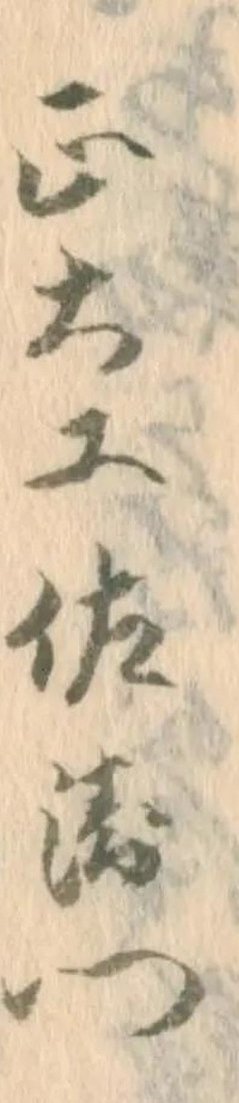正大工左衛門
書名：賀茂社記録. 第17冊
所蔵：国立国会図書館 National Diet Library, JAPAN
